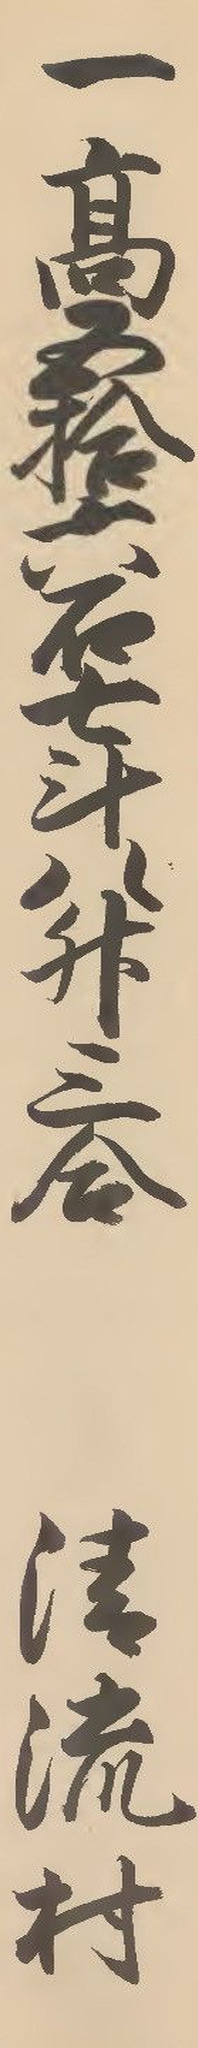一高五拾六石七斗八升三合清流村
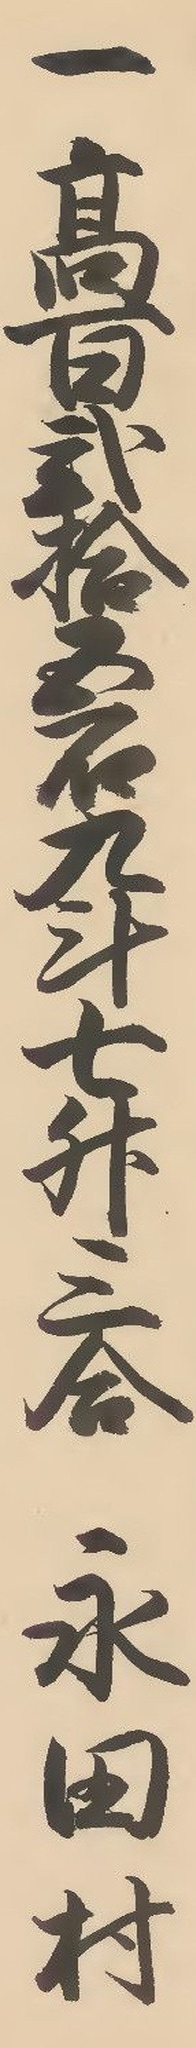一高百弐拾五石九斗七升三合永田村
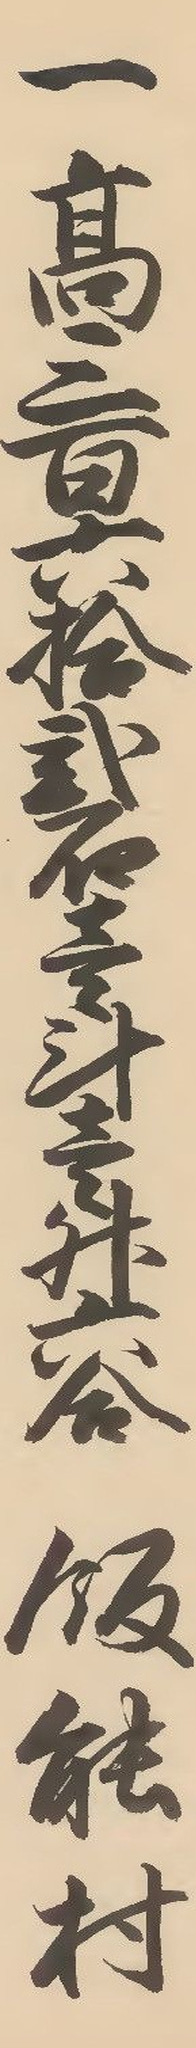一高三百六拾弐石壱斗壱升六合飯能村
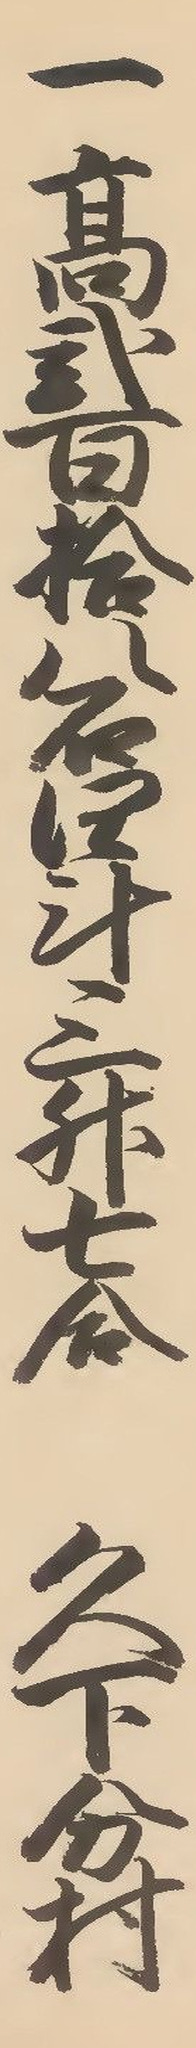一高弐百拾八石四斗三升七合久下分村
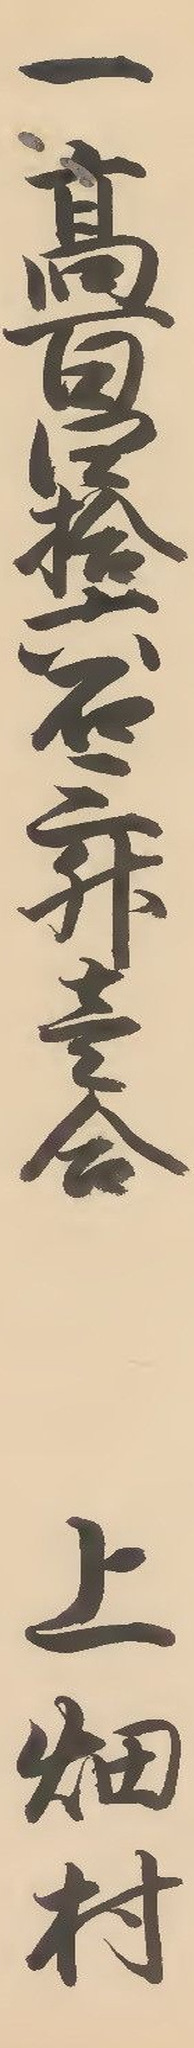一高百四拾六石三升壱合上畑村

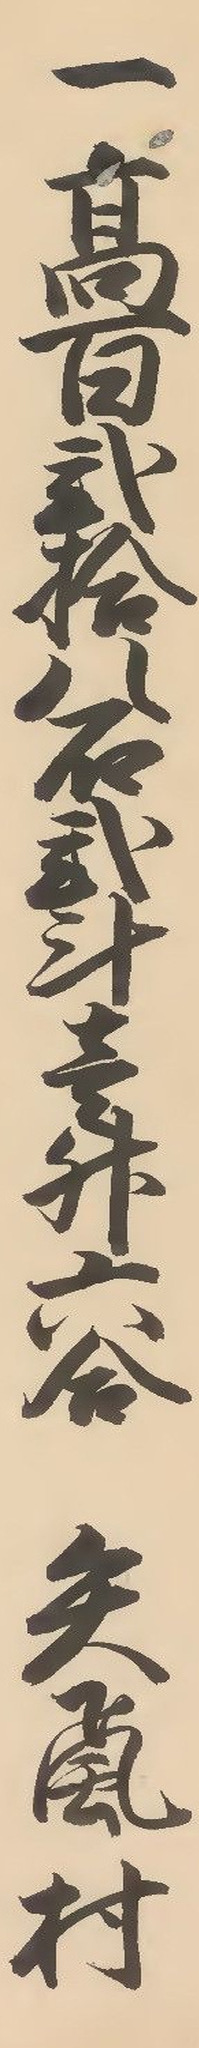一高百弐拾八石弐斗壱升六合矢颪村
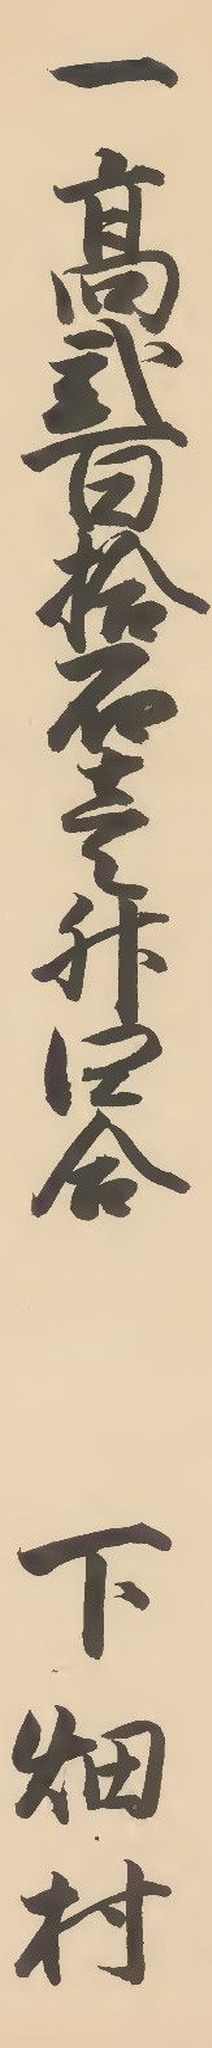一高弐百拾石壱升四合下畑村
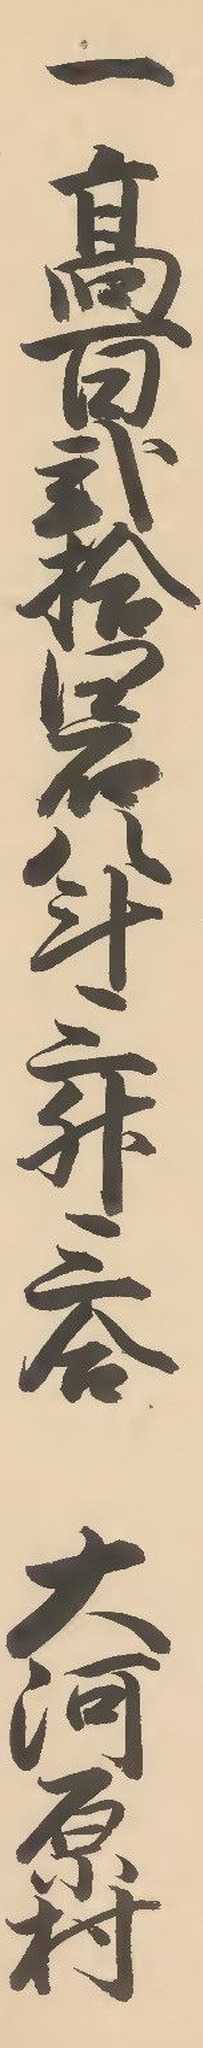一高百弐拾四石八斗三升三合大河原村
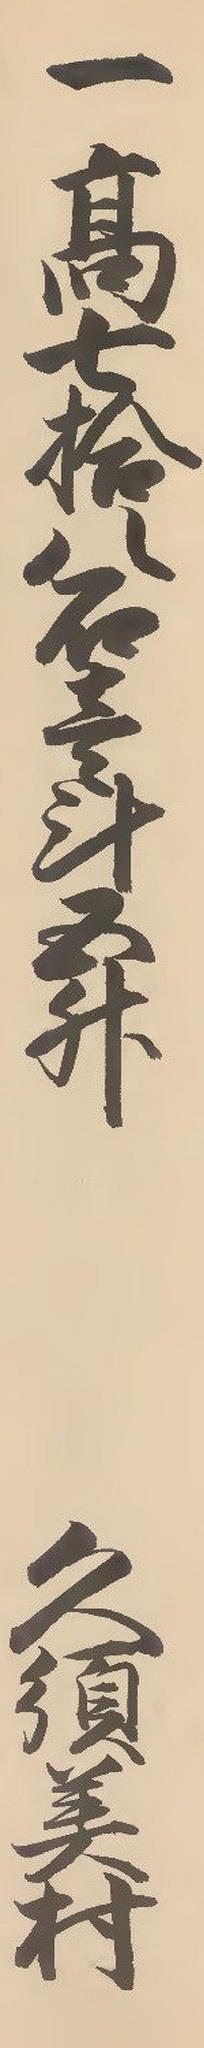一高七拾八石壱斗五升久須美村
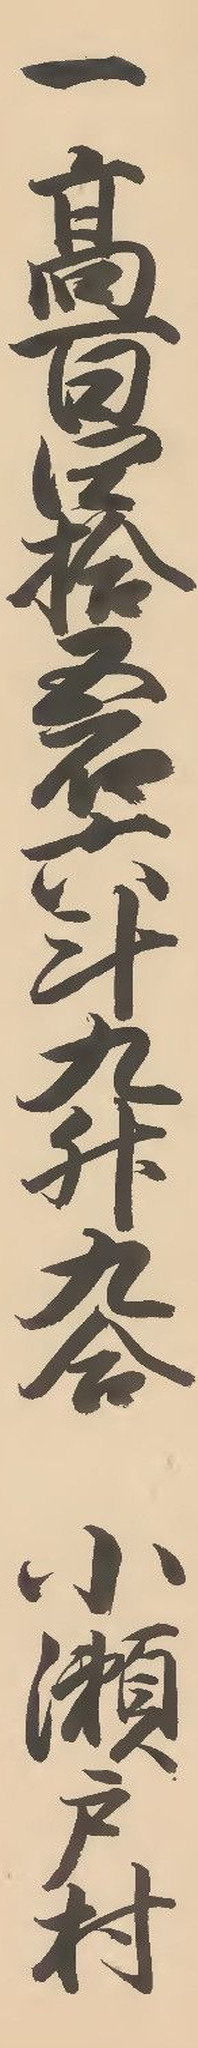一高百四拾五石六斗九升九合小瀬戸村
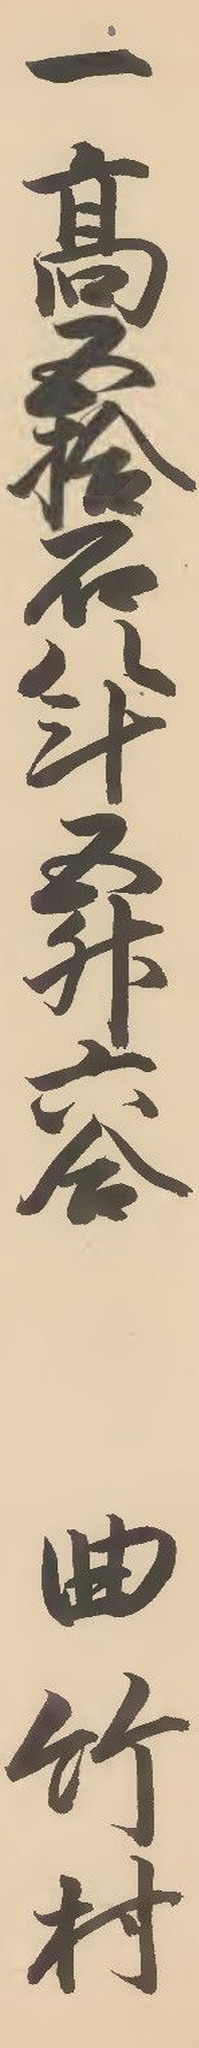一高五拾石八斗五升六合曲竹村
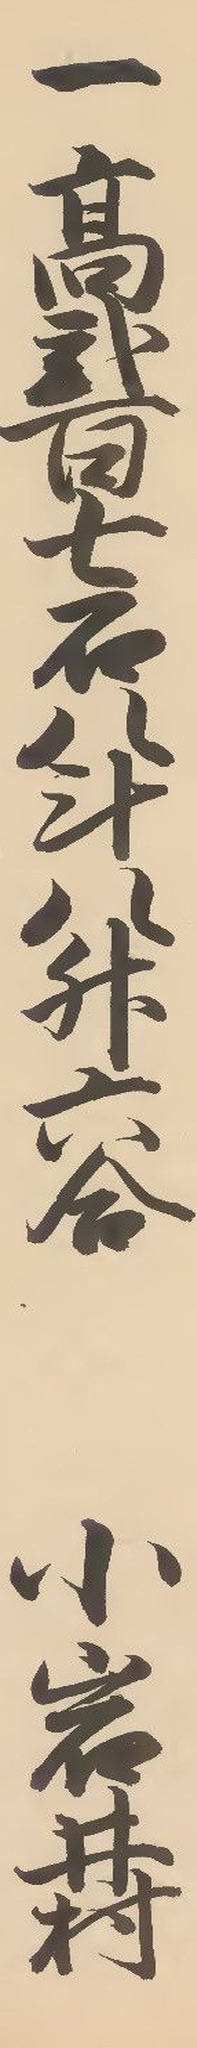一高弐百七石八斗八升六合小岩井村
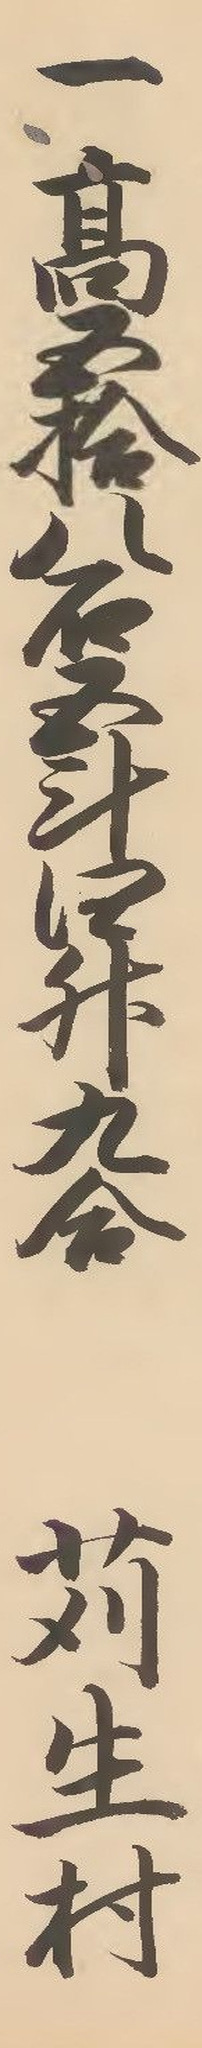一高五拾八石五斗四升九合苅生村

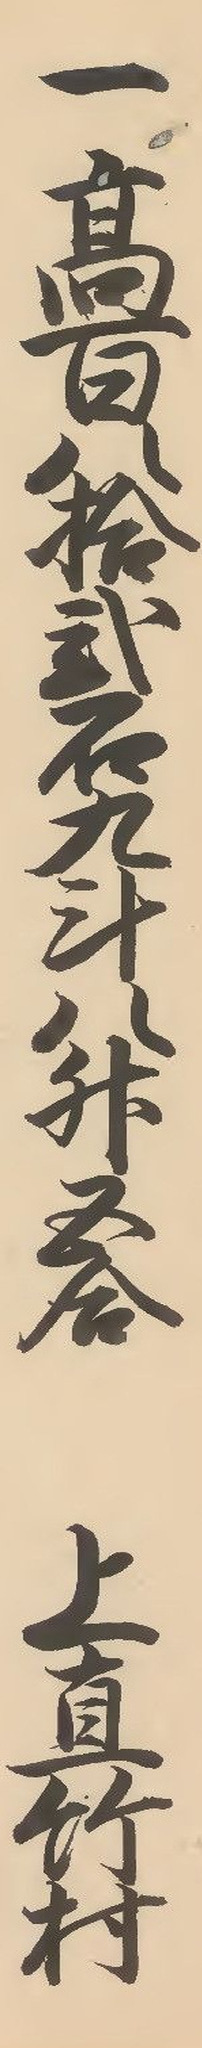一高百八拾弐石九斗八升五合上直竹村
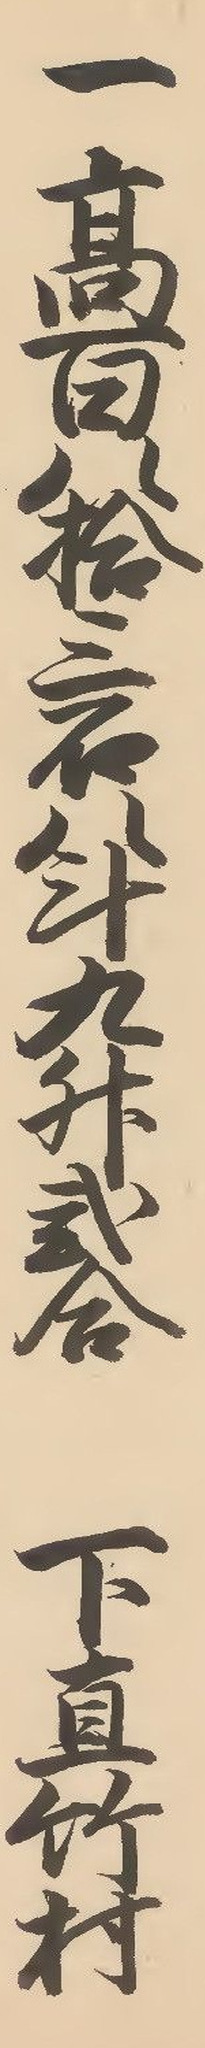一高百八拾三石八斗九升弐合下直竹村
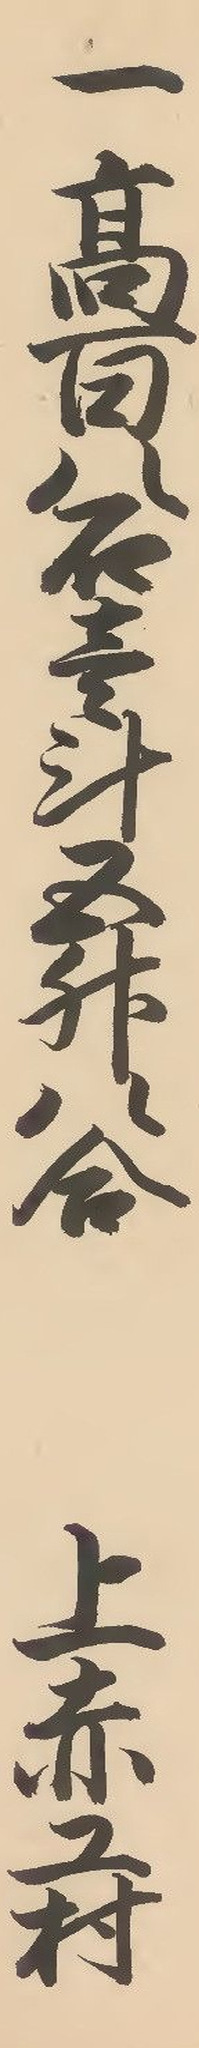一高百八石壱斗五升八合上赤工村
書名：武蔵国郷帳　上
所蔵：国立公文書館 National Archives of Japan
